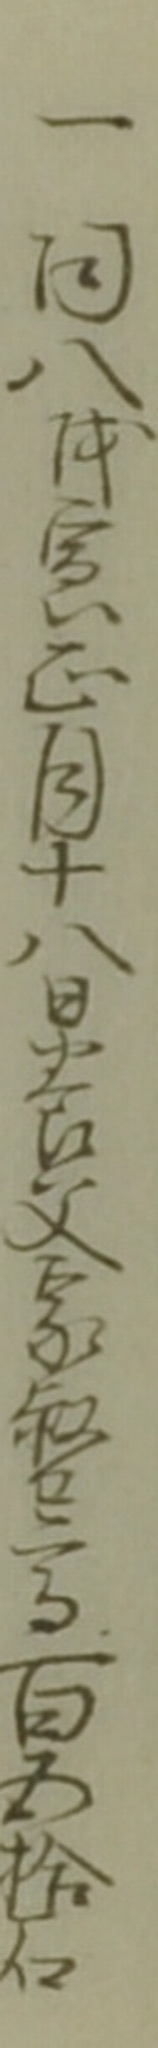一同八戊寅正月十八日養父家督高百五拾石
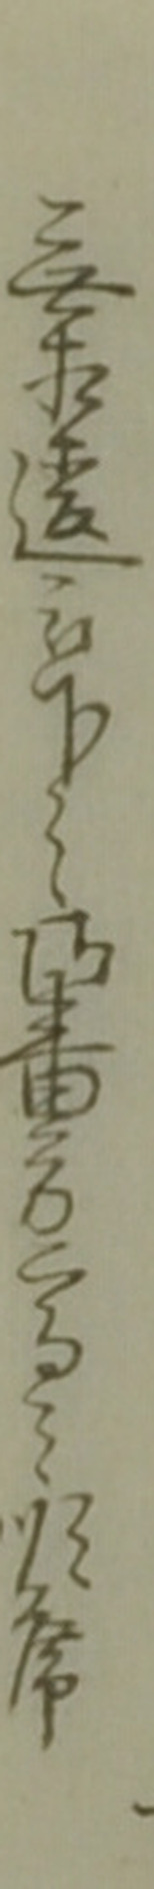無相違被下之御番方高之順席
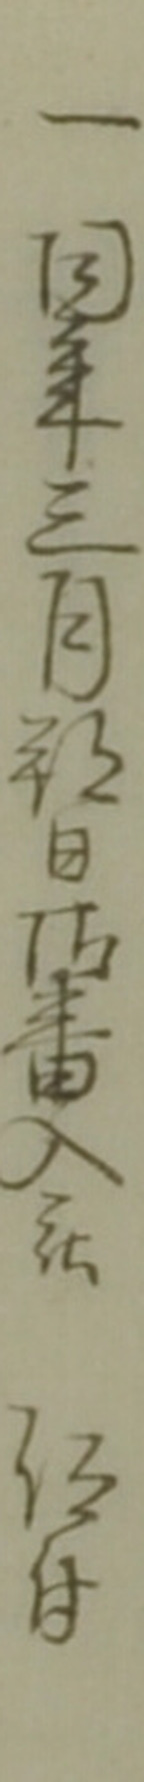一同年三月朔日御番入被仰付
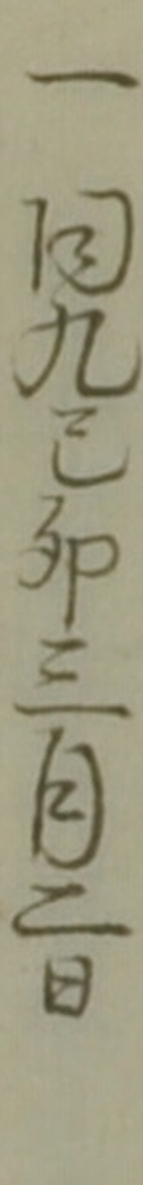一同九己辰三月二日
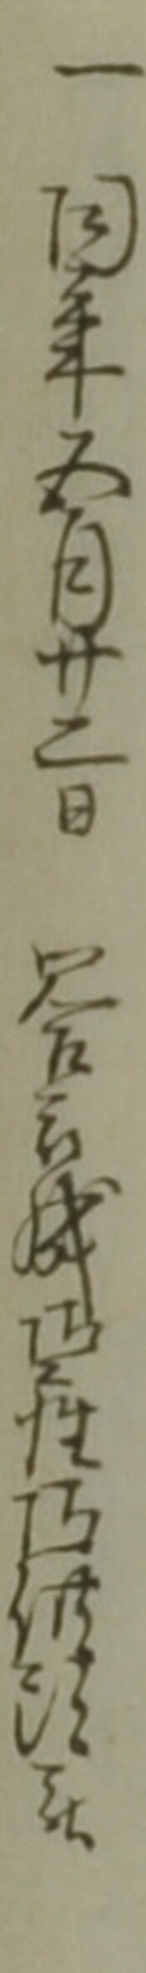一同年五月廿二日思召被成御座御供頭被
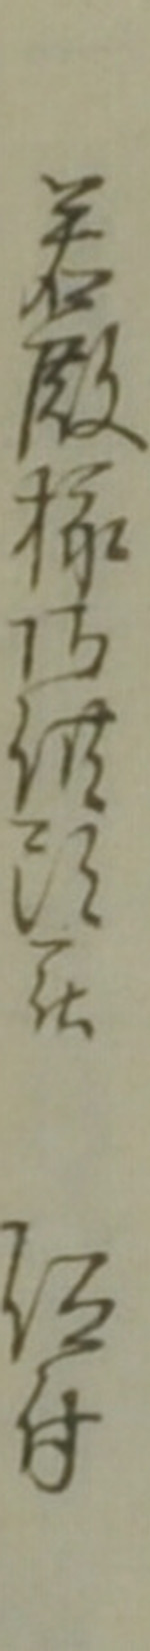若殿様御供頭被仰付
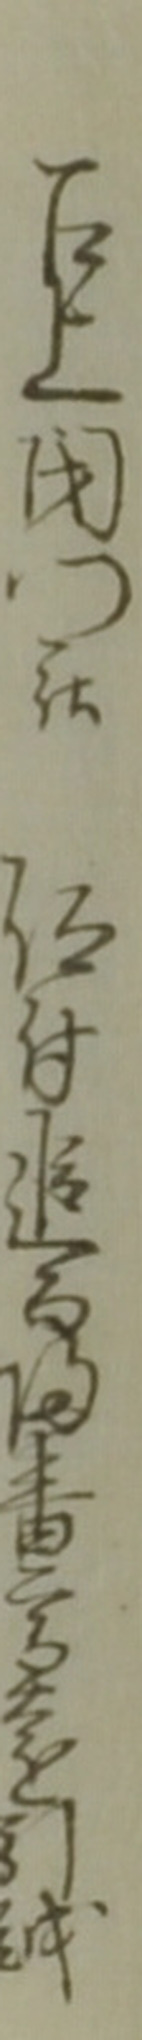召上閉門被仰付追而帰番高遠引越
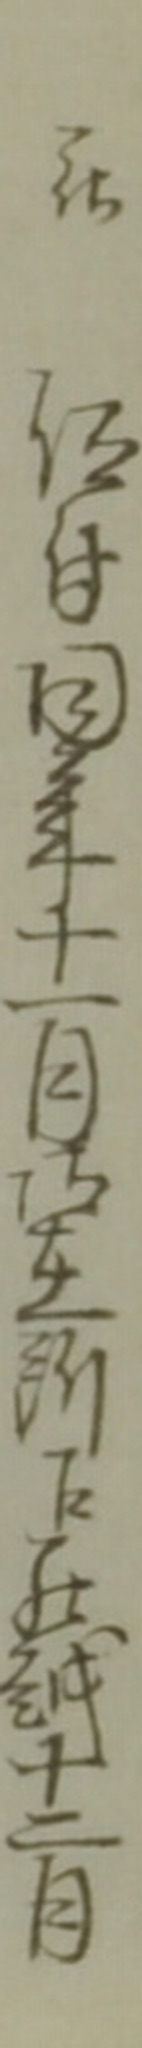被仰付同年十一月御在所江罷越十二月
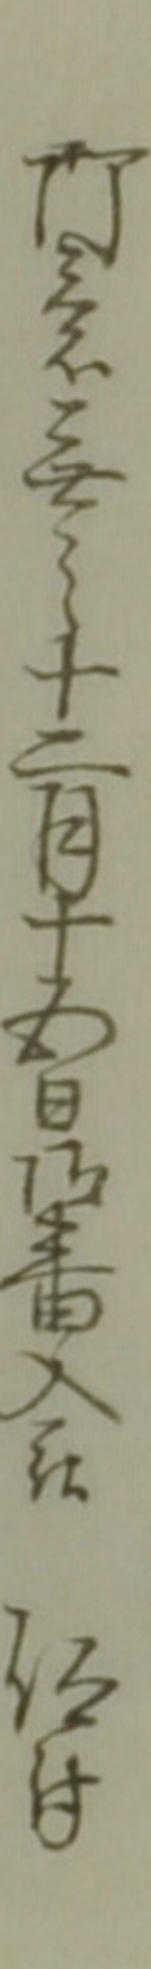御意無之十二月十五日御番入被仰付
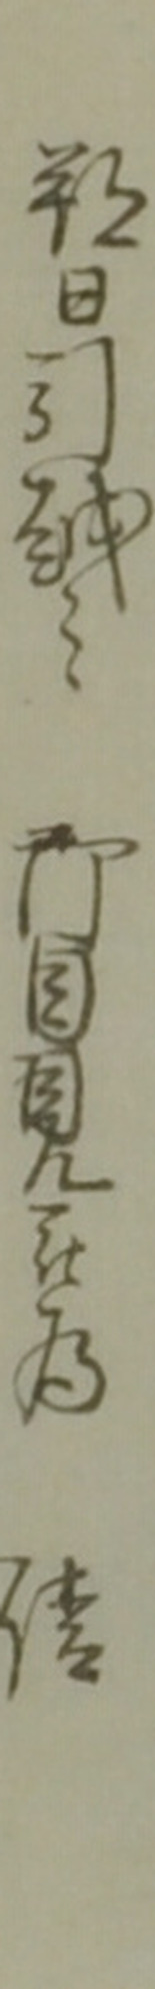朔日引越之御目見被為請
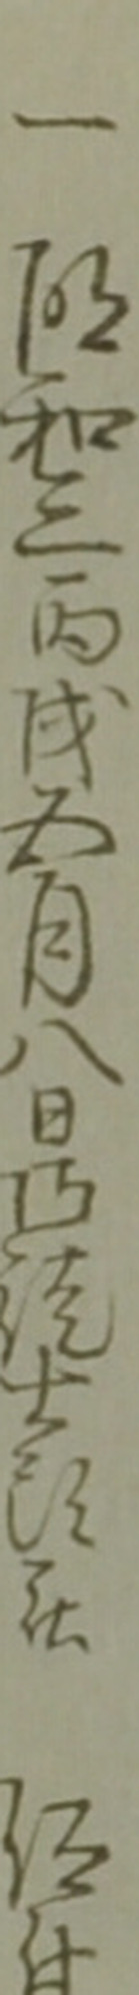一明和三丙戌五月八日御徒士頭被仰付
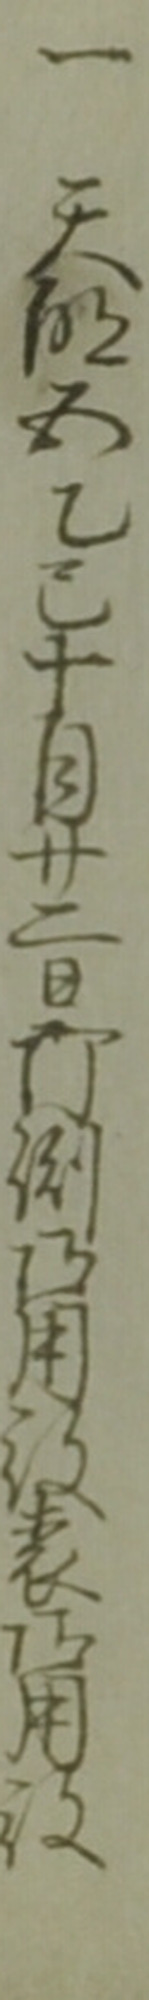一天明五乙巳十月廿二日御側御用役表御用役
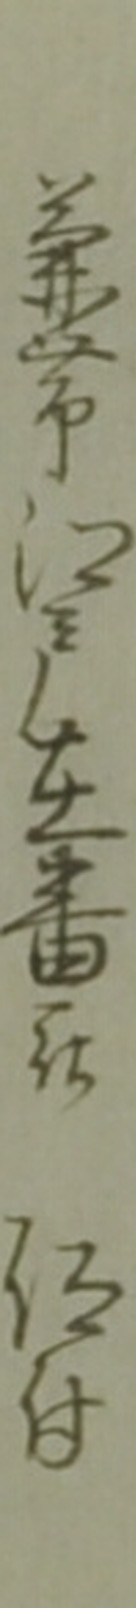兼帯江戸在番被仰付
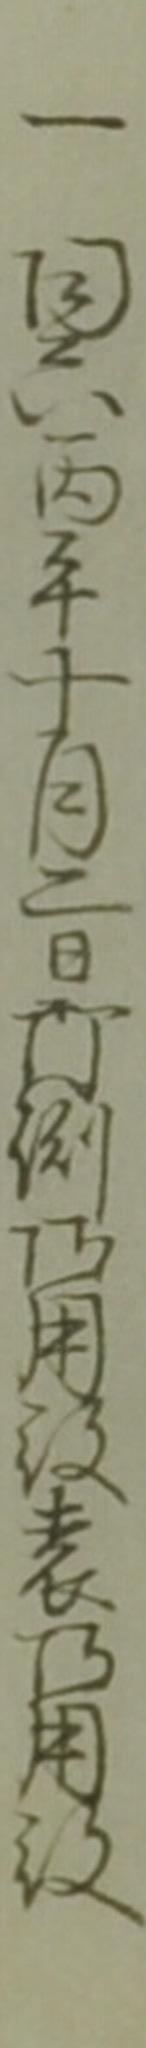一同六丙午十月二日御側御用役表御用役
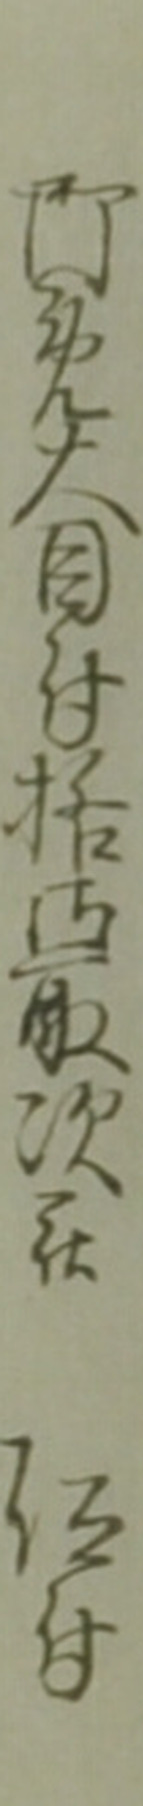御免大目付格御取次被仰付
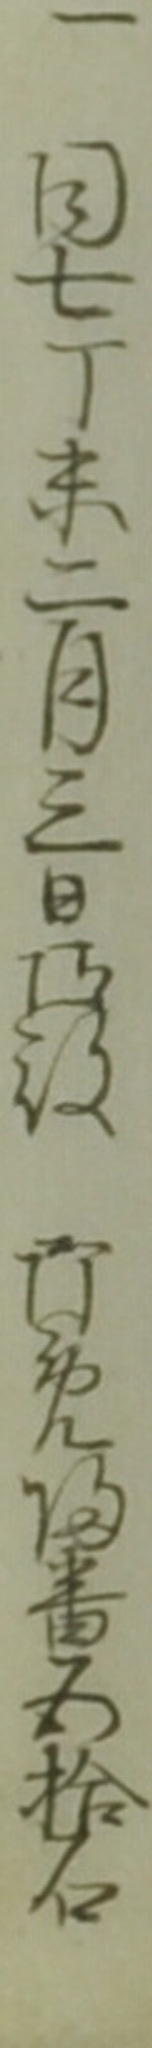一同七丁未二月三日御役御免帰番五拾石
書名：給人諸士勤仕録（三）
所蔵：伊那市立高遠町図書館・合同会社AMANE
